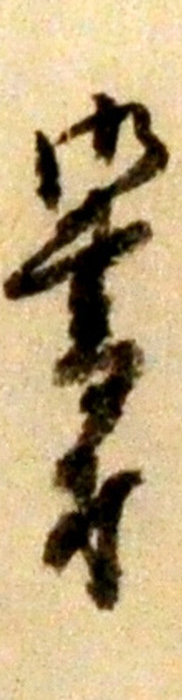御書付

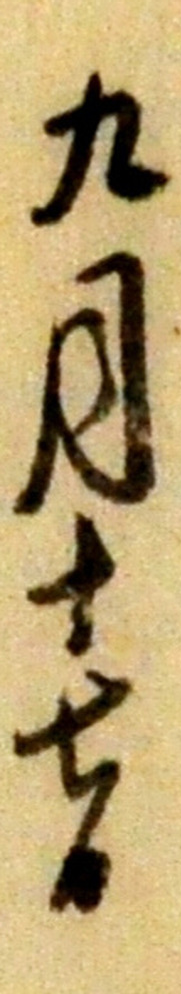九月十七日
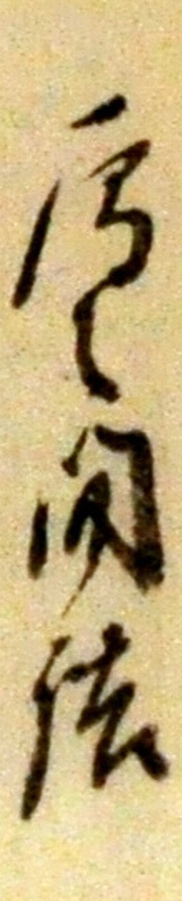鳫之間詰
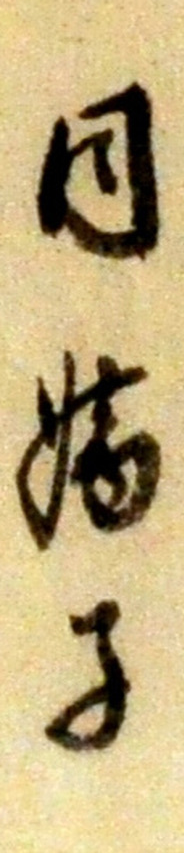同嫡子
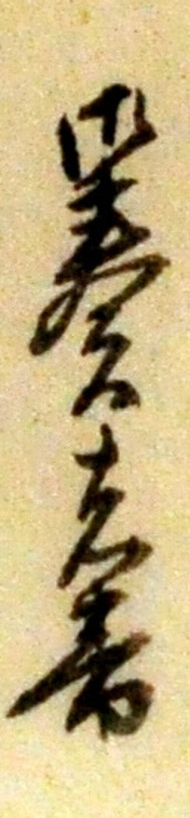御奏者番
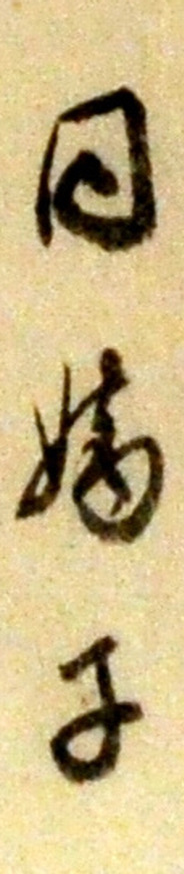同嫡子
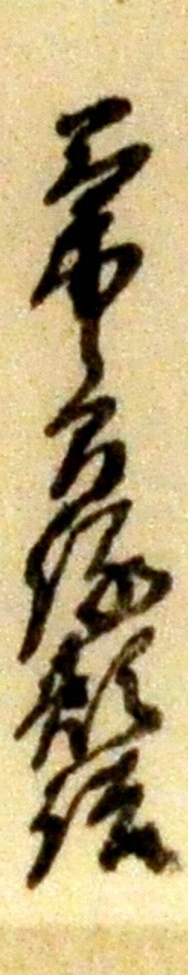菊之間縁頬詰
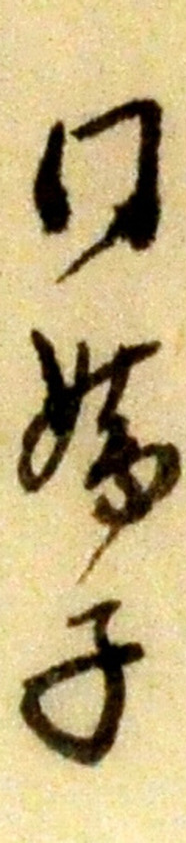同嫡子
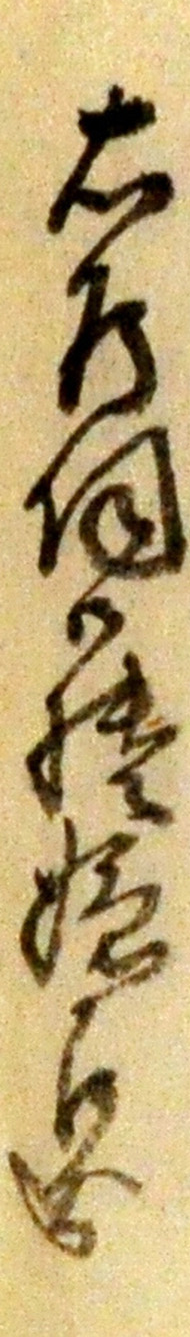右為伺御機嫌召出
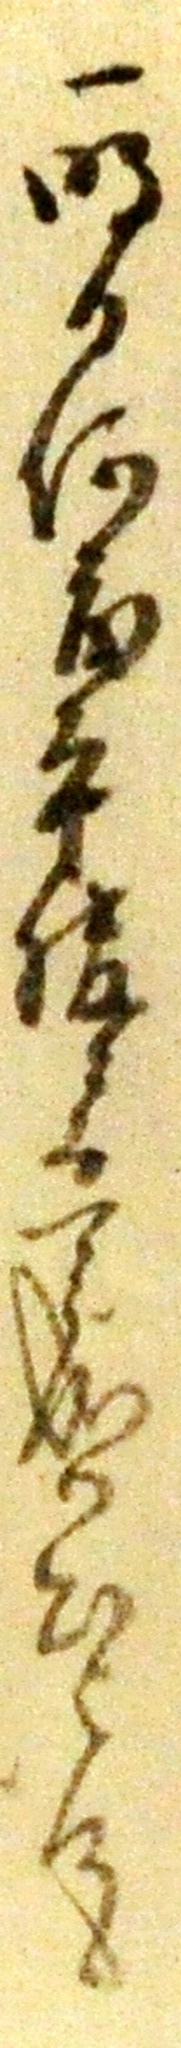一明日何茂平服ニ而可被成候出与存候
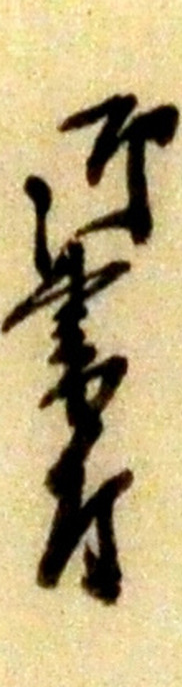御書付
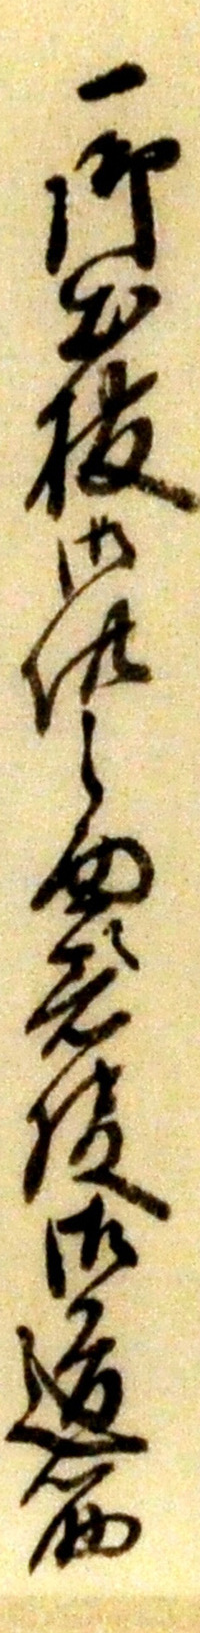一御出棺御供之面々着服御道筋
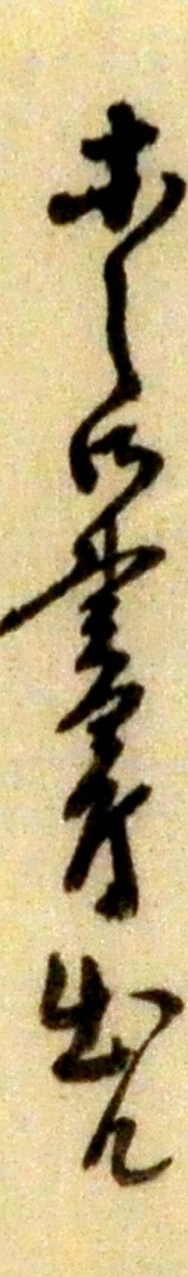等之御書付出ル
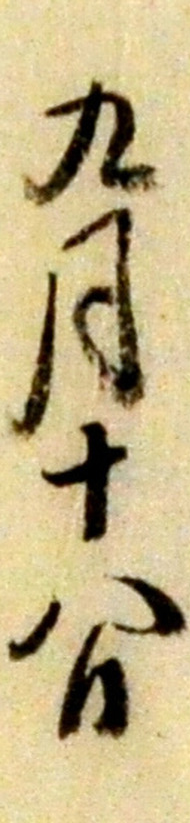九月十八日
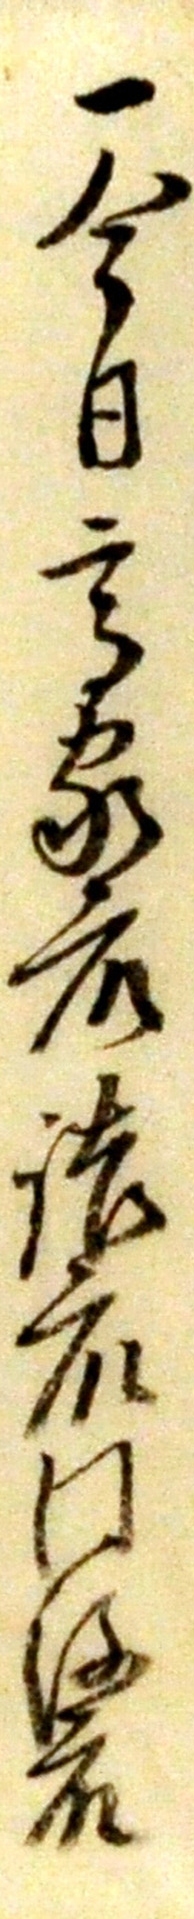一今日高家衆庶流同役衆
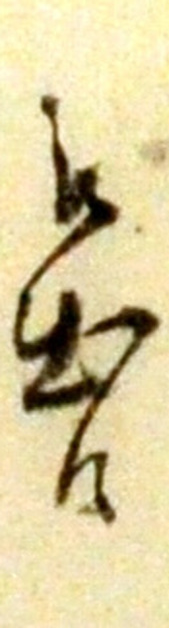江出候
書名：書抜
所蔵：伊那市立高遠町図書館・合同会社AMANE
